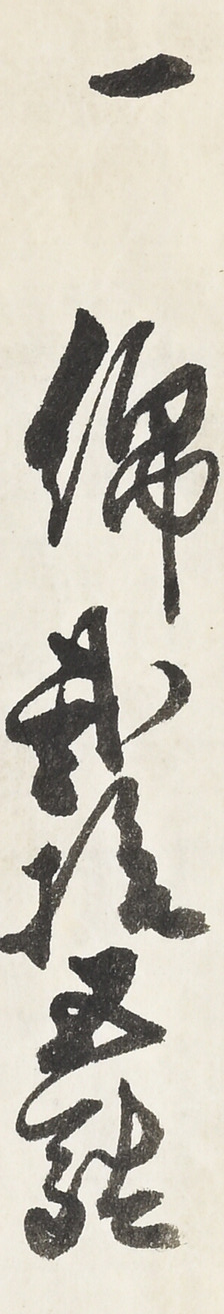一綿弐拾五駄但
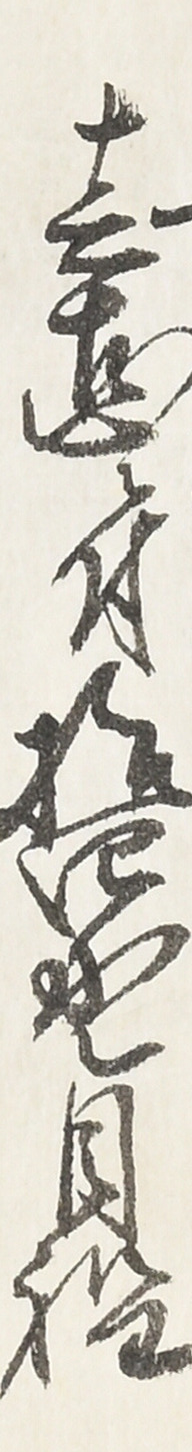壱固ニ付拾四貫目程
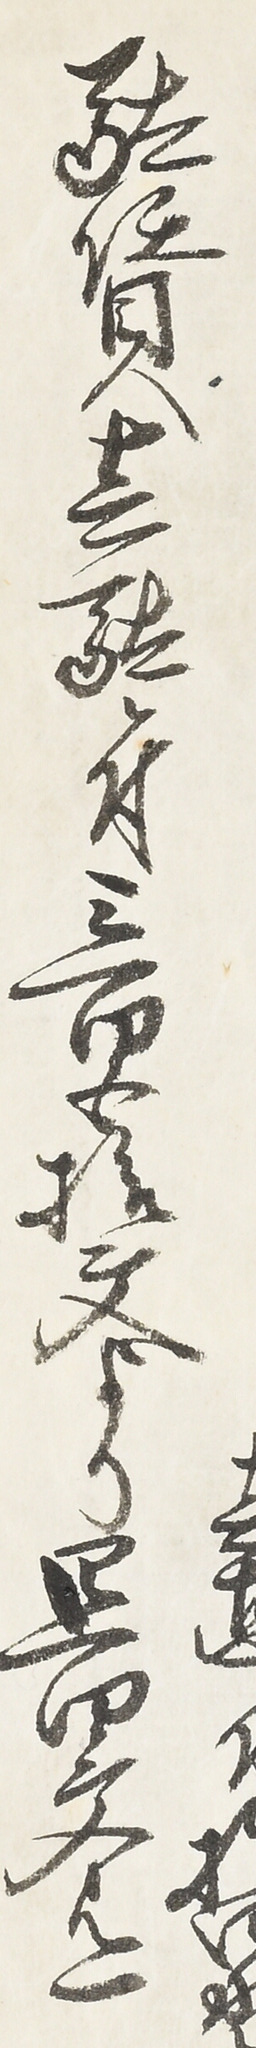駄賃壱駄ニ付三百五拾文より四百文迄
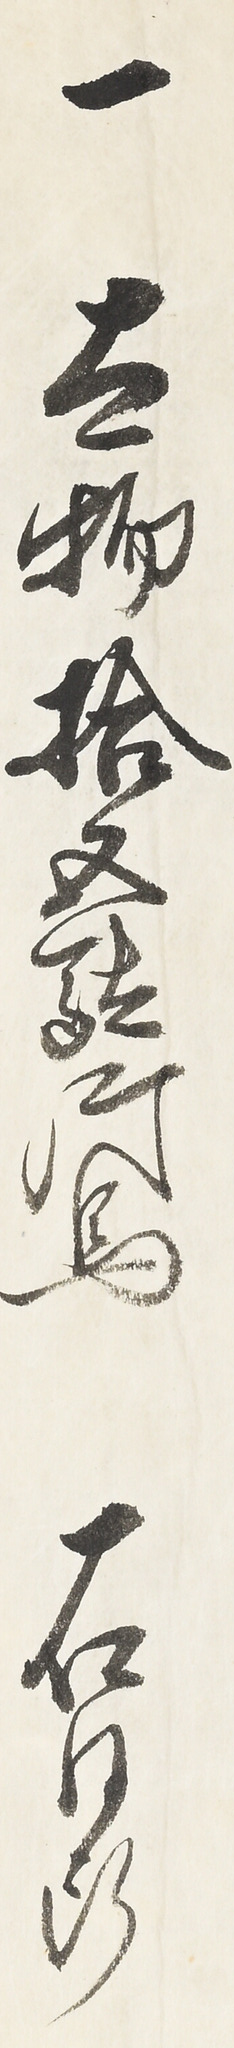一太物拾五駄片馬右同断
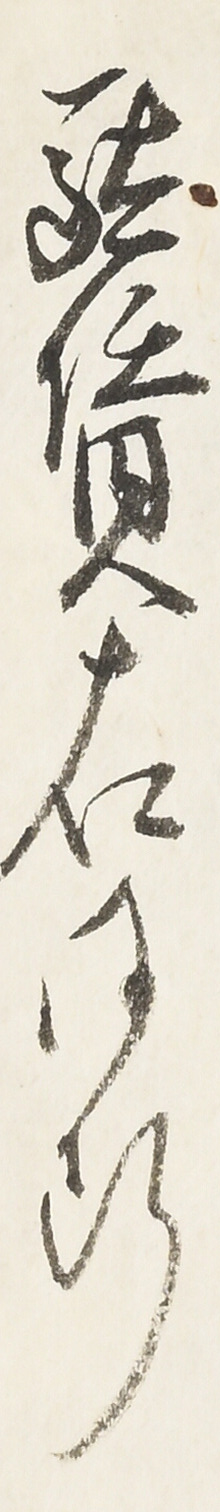駄賃右同断
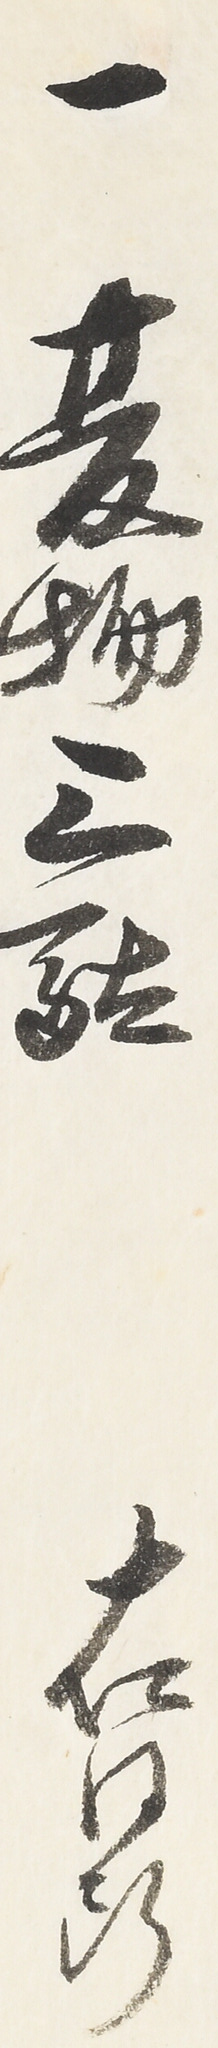一夏物三駄右同断
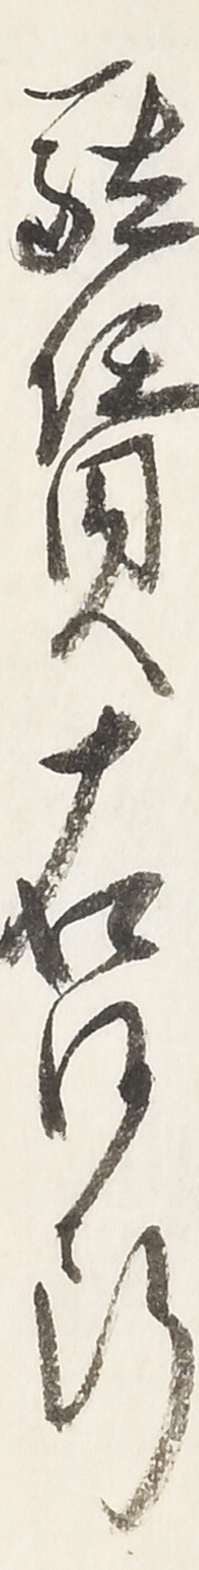駄賃右同断
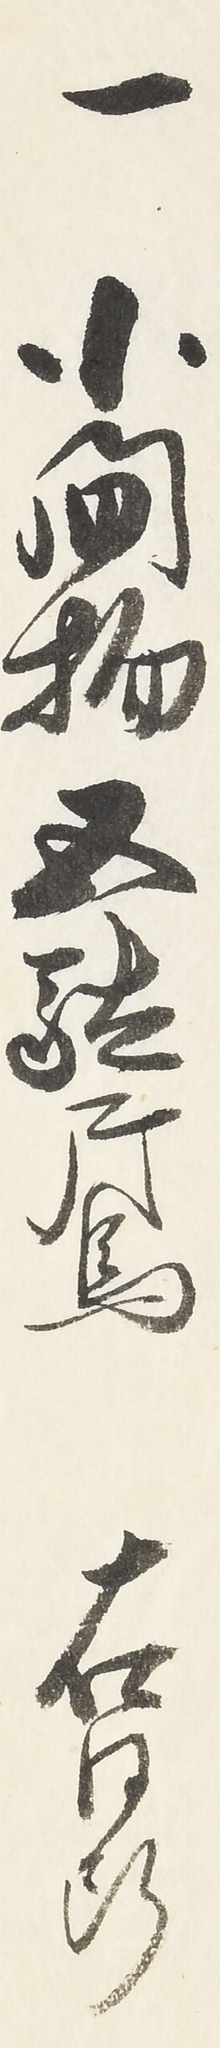一小間物五駄片馬右同断
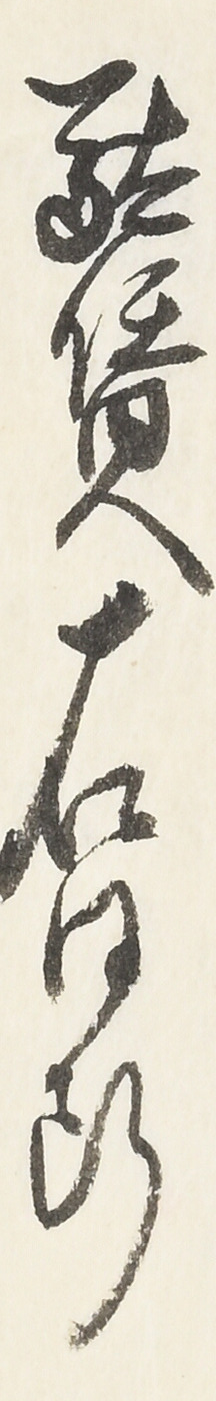駄賃右同断
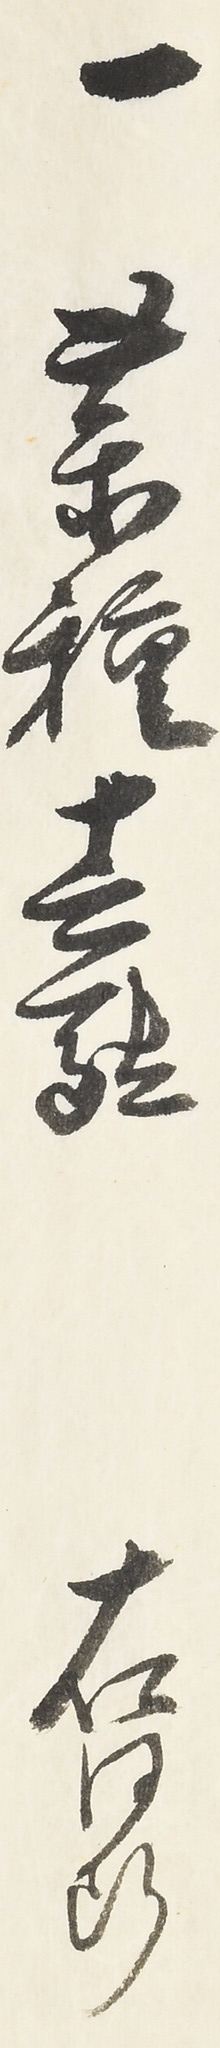一菜種壱駄右同断
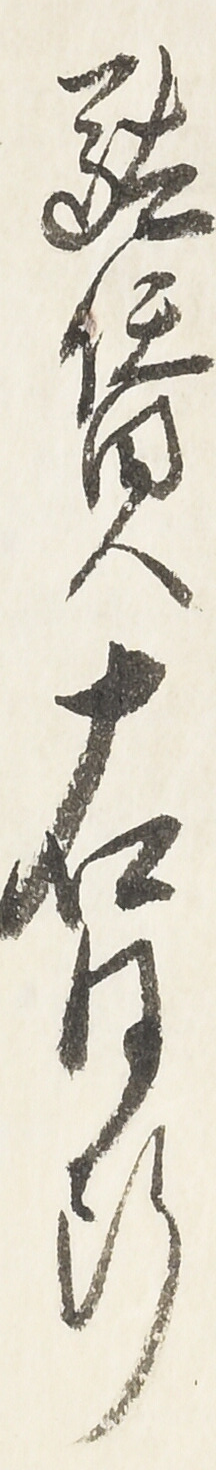駄賃右同断
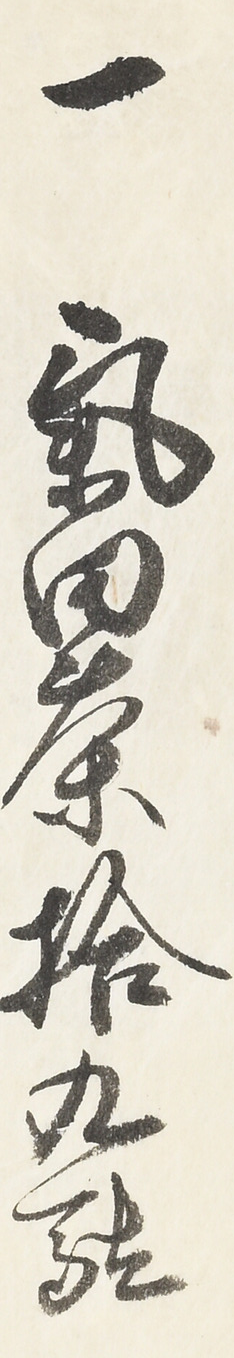一気田茶拾九駄但
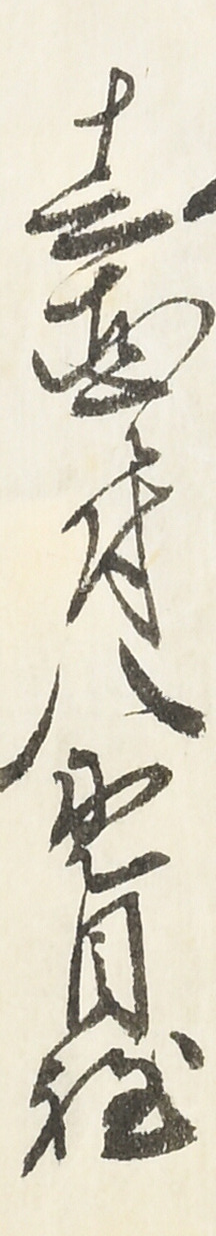壱固ニ付八貫目程
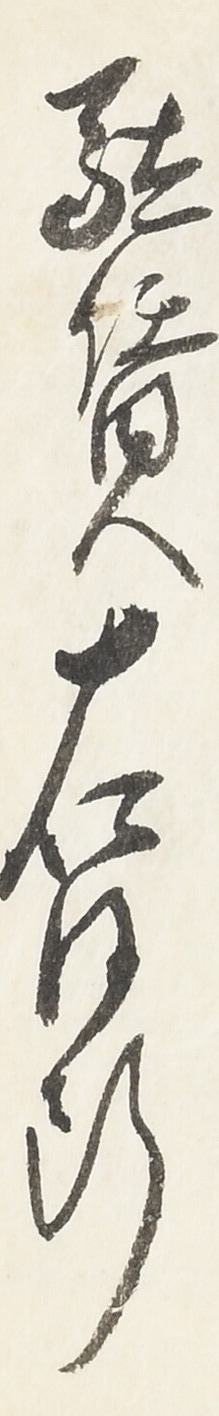駄賃右同断

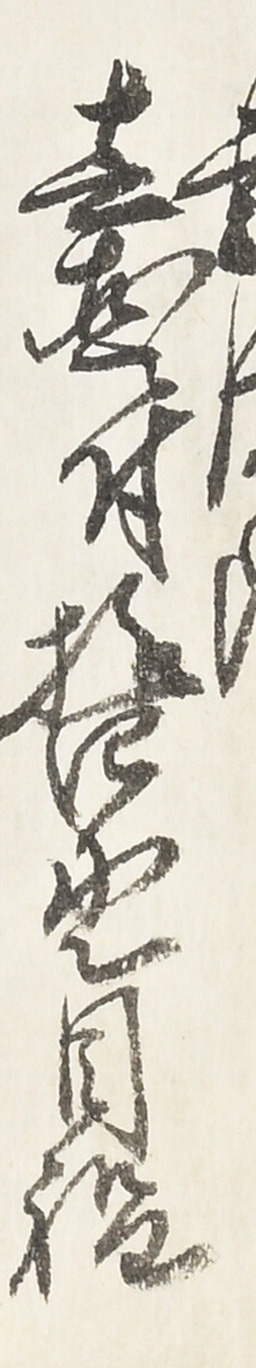壱固ニ付十四貫目程
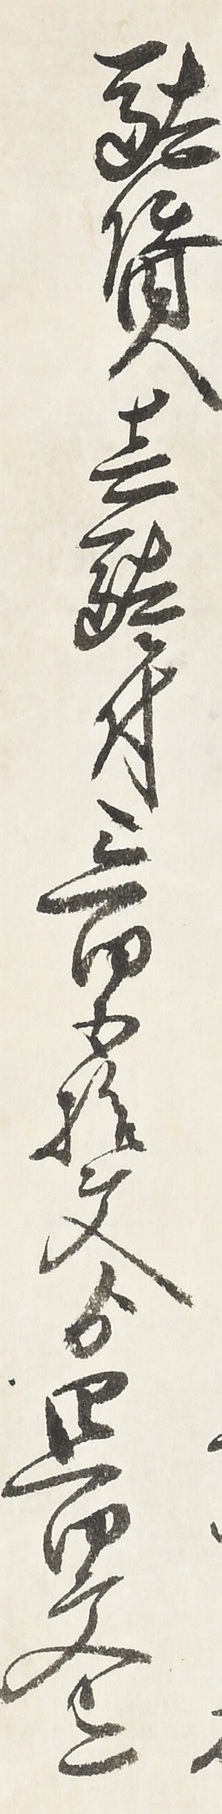駄賃壱駄ニ付三百五拾文ゟ四百文迄
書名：中馬ニテ附通候出入荷物目録帳
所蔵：伊那市立高遠町図書館・合同会社AMANE
